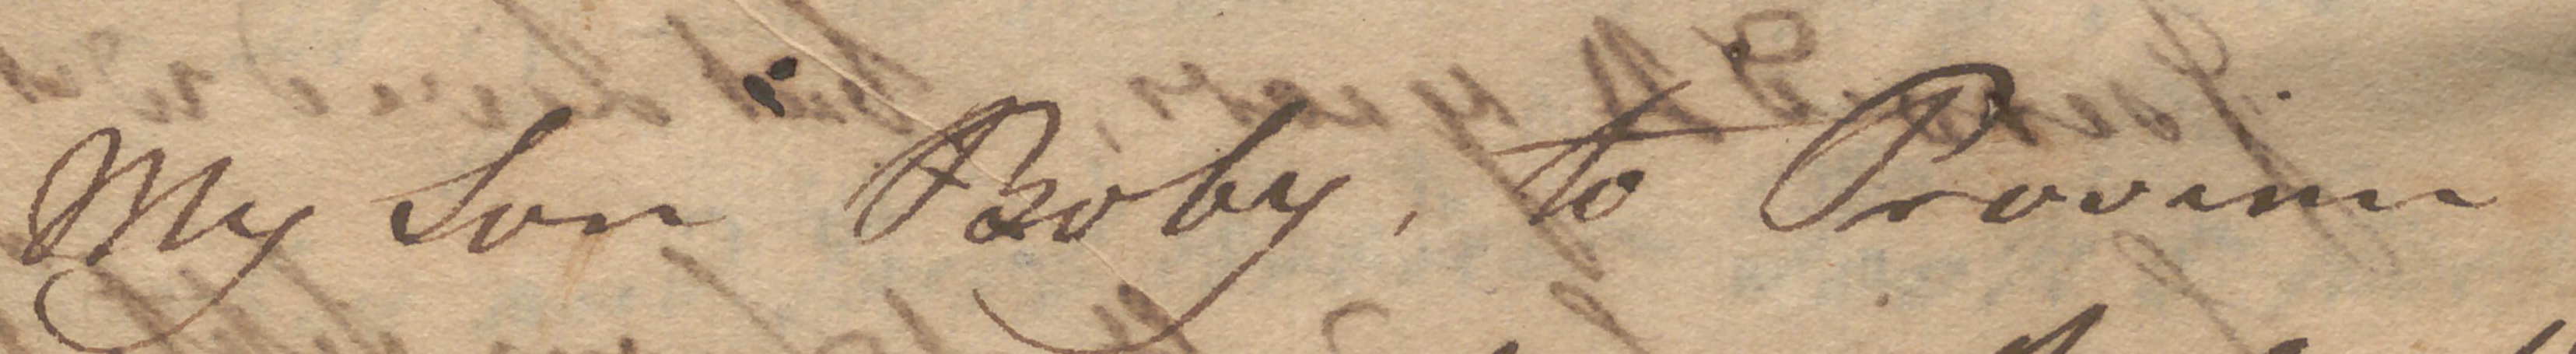My son Bobey, to Province
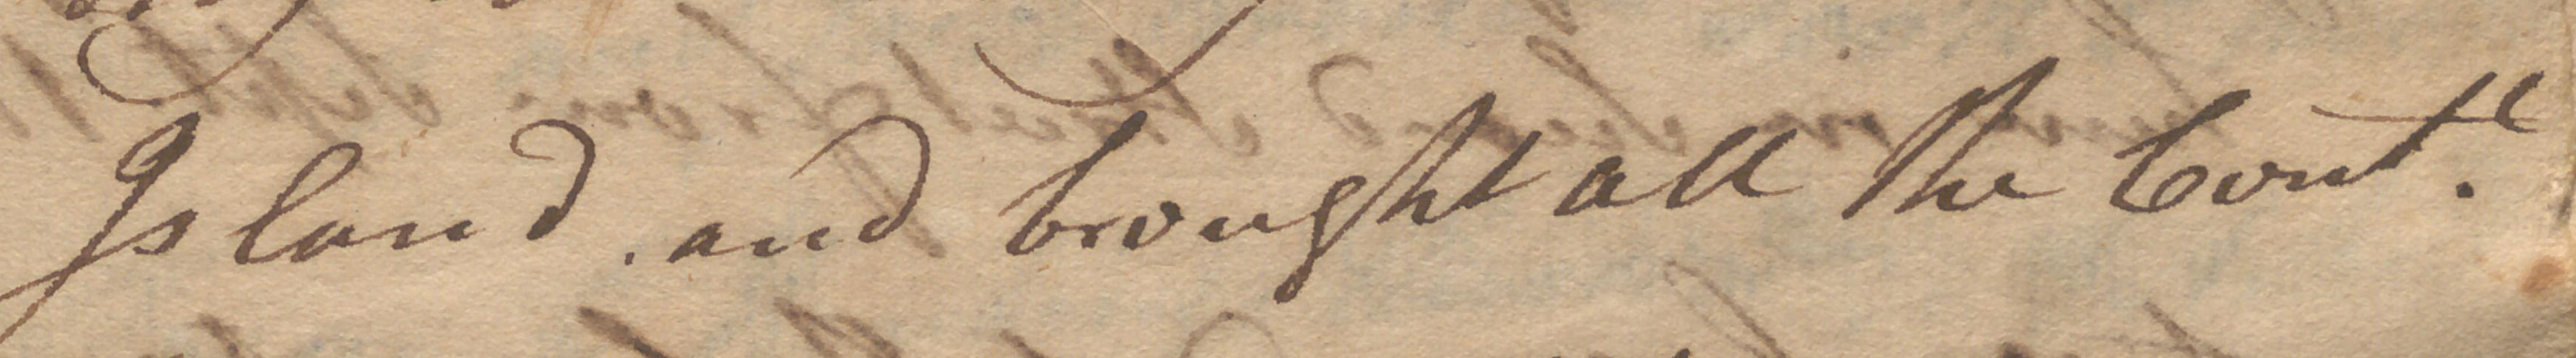Island and brought all the Cont^l.
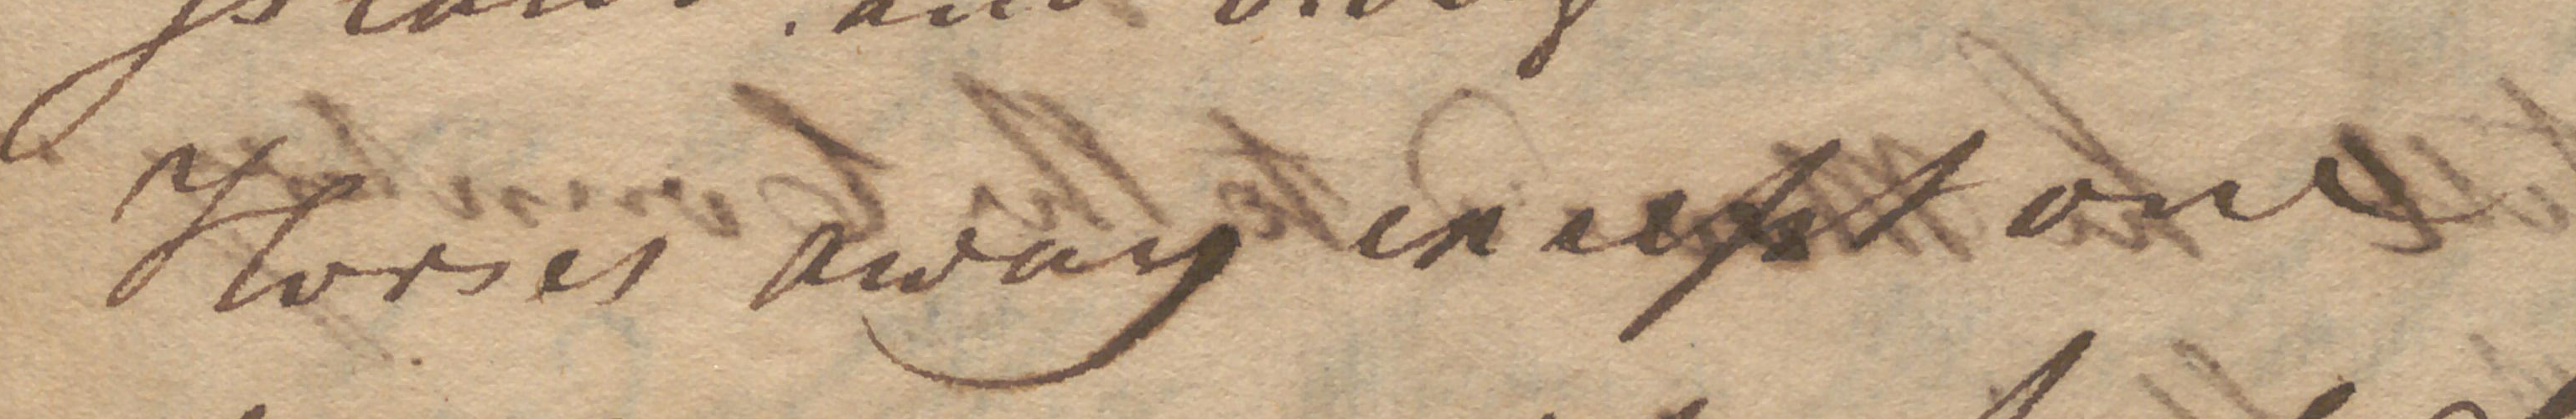Horses away except one
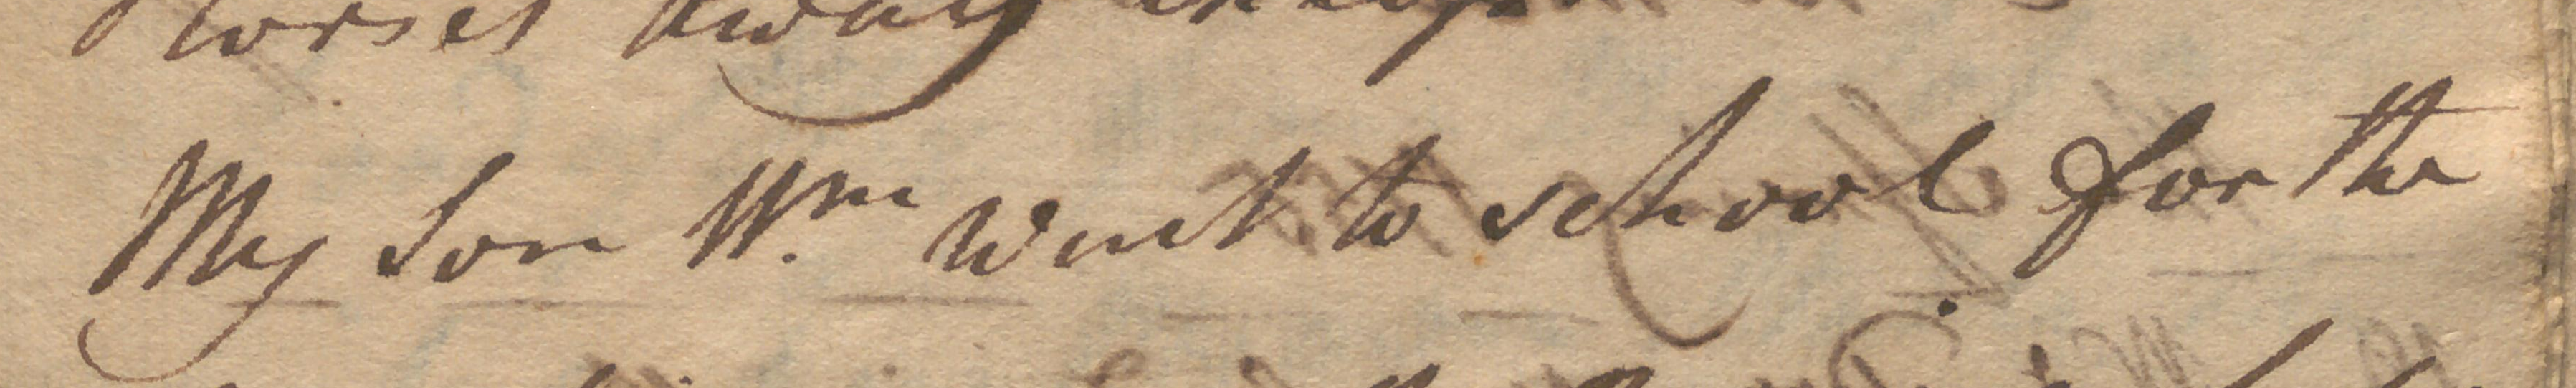My Son W^m. went to school for the
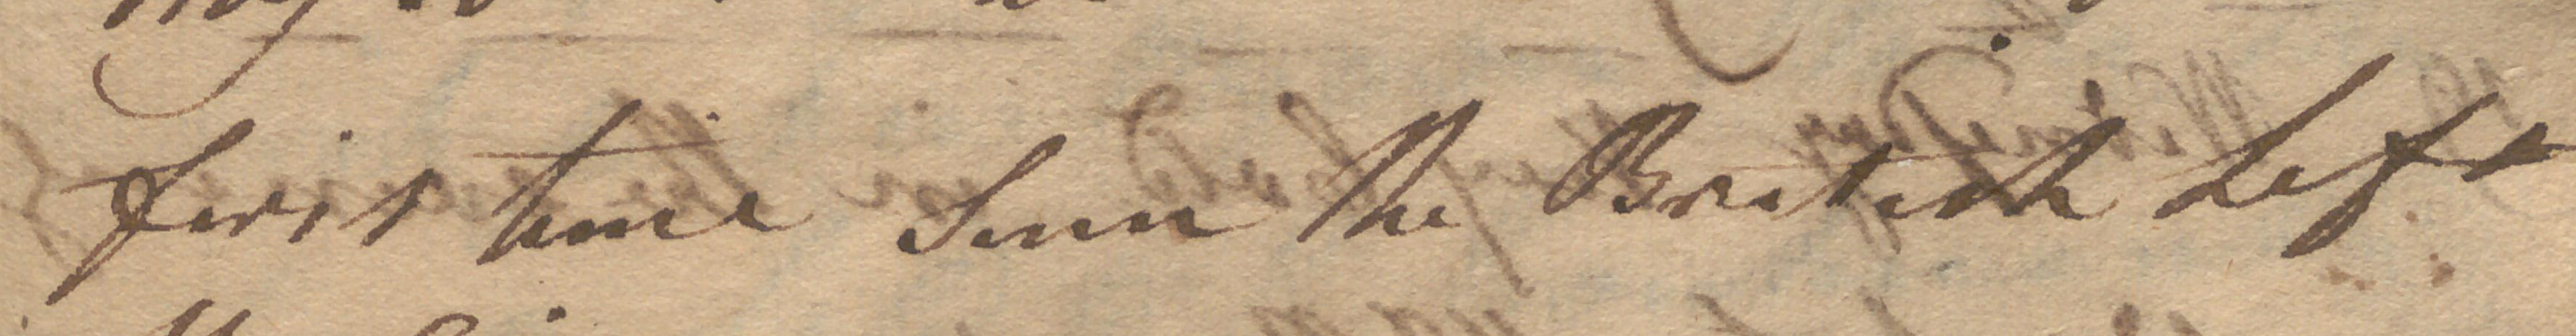first time since the British Left
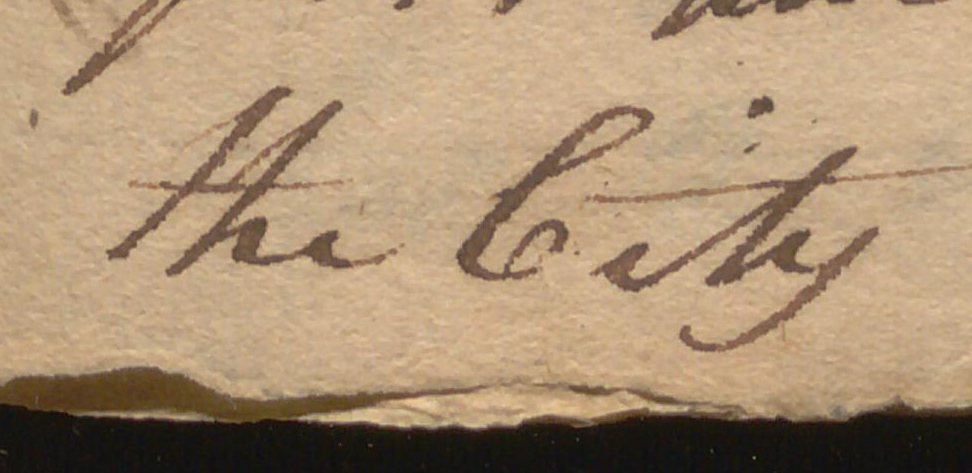the City
